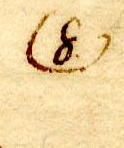8
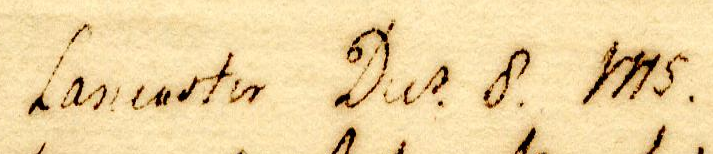Lancaster Dec^r. 6. 1775.
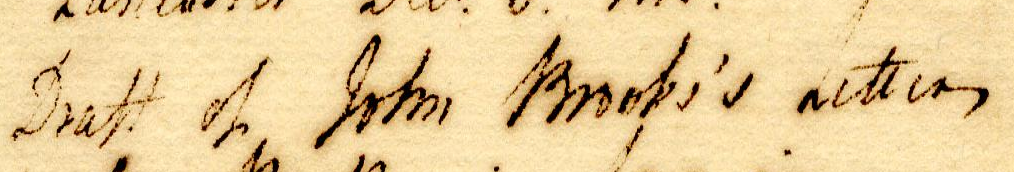Draft of John Brooks's Letter
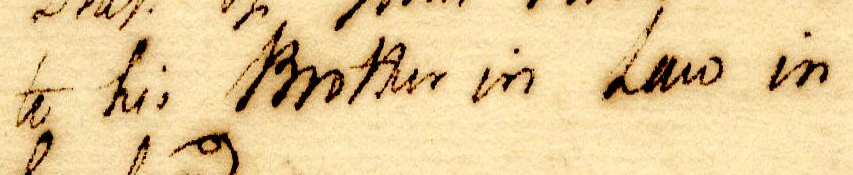to his Brother in Law in
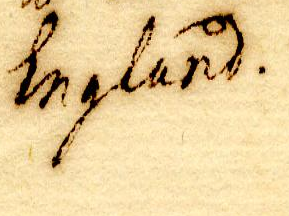England.
